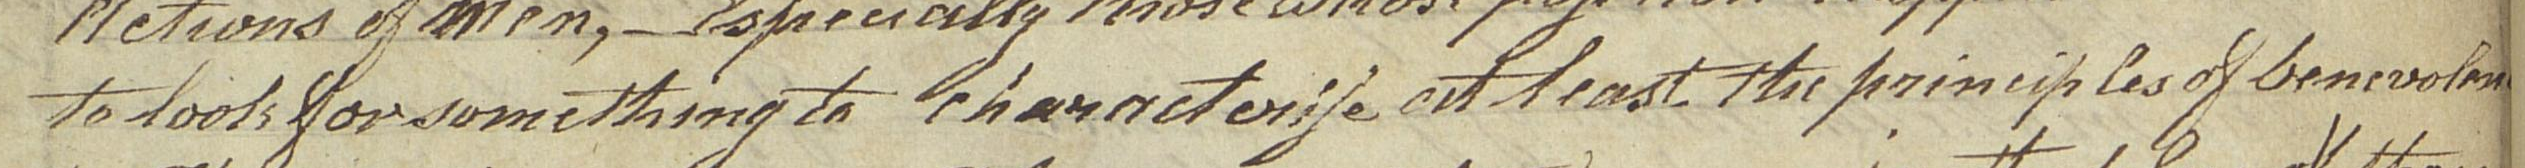to look for something to characterise at least the principles of benevolence
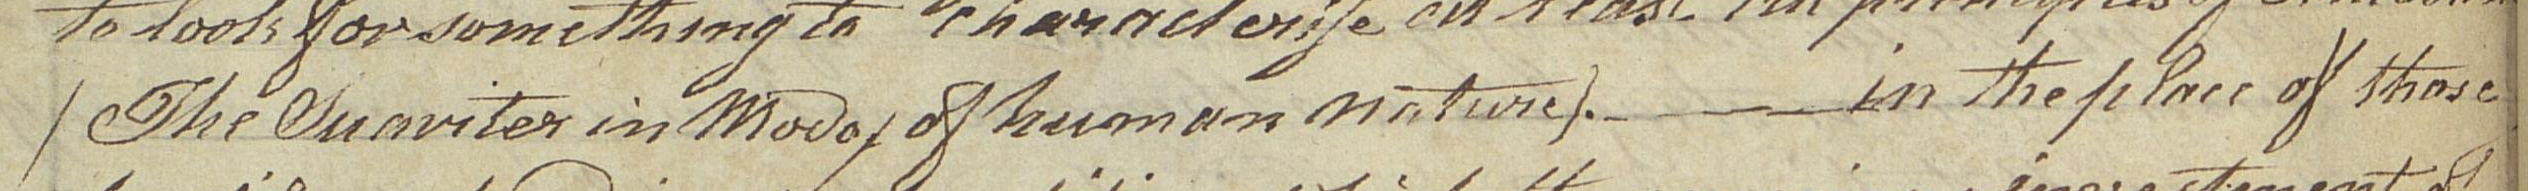The Suaviter in Modo, of human nature). in the place of those
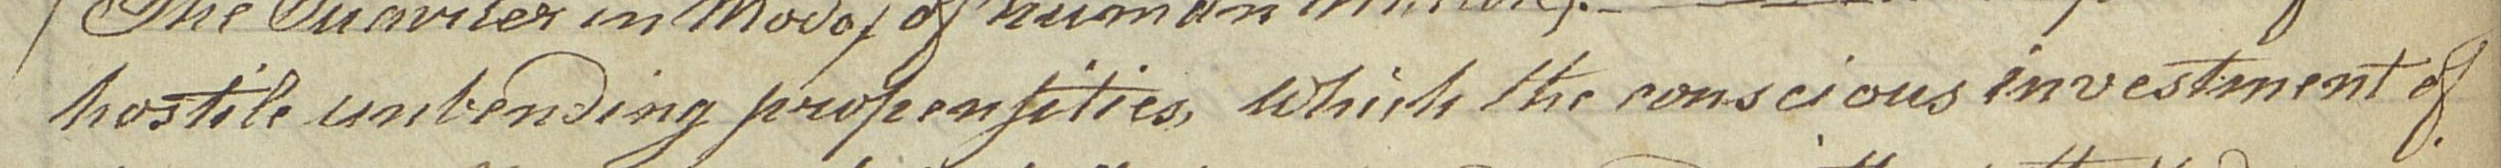hostile unbending propensities, which the conscious investment of
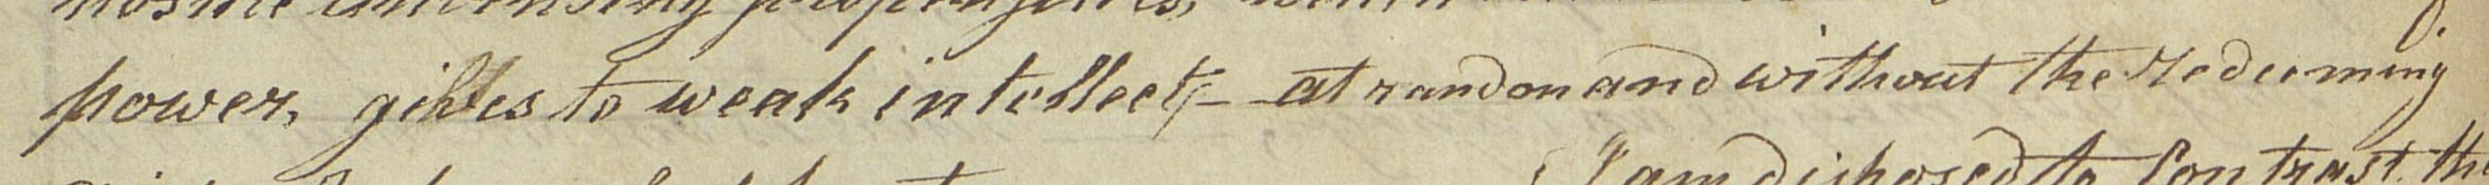power, gives to weak intellect, at random and without the redeeming
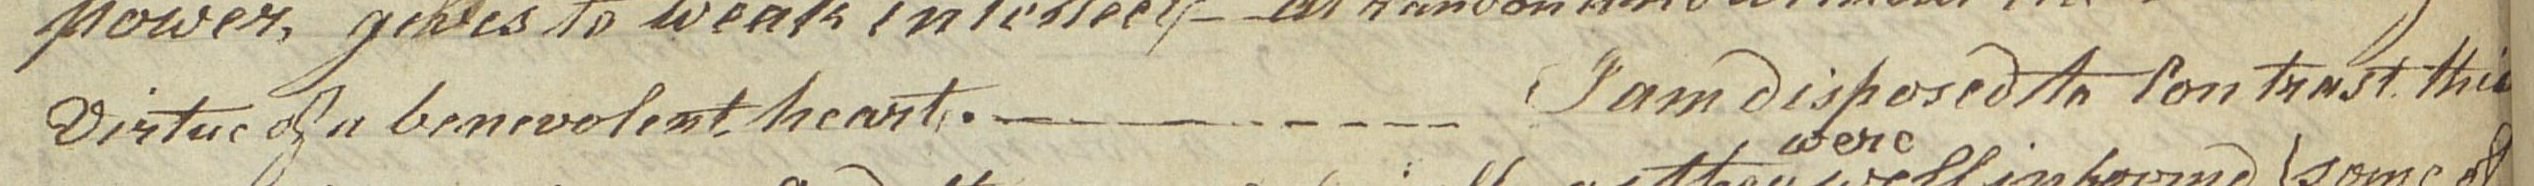Virtue of a benevolent heart. I am disposed to contrast this
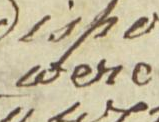were
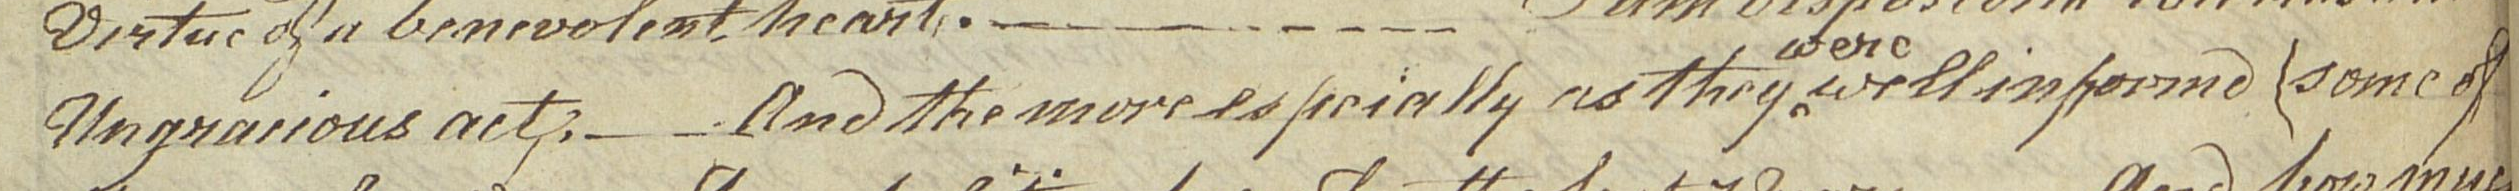Ungracious act; And the more especially as they ^ well informd (some of
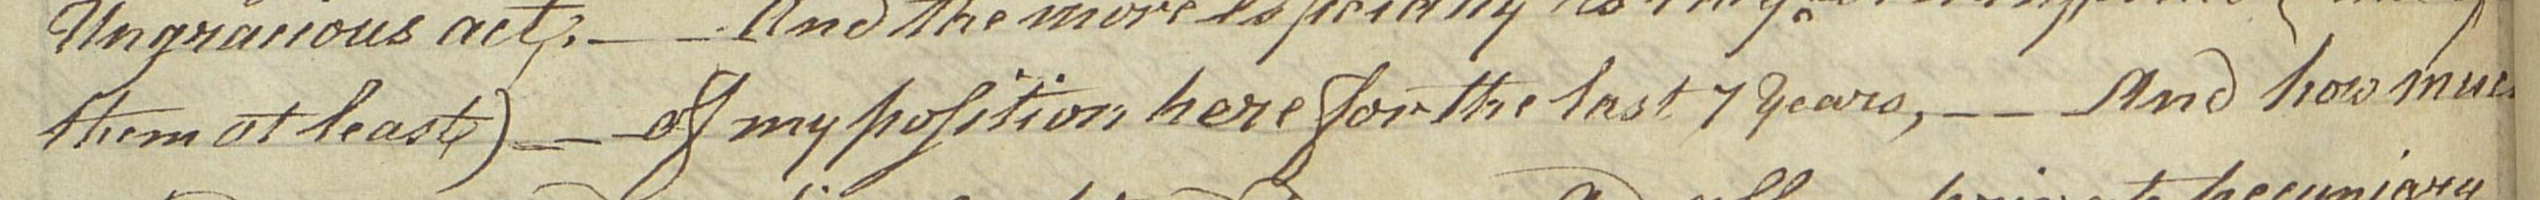them at least) of my position here for the last 7 Years, And how much
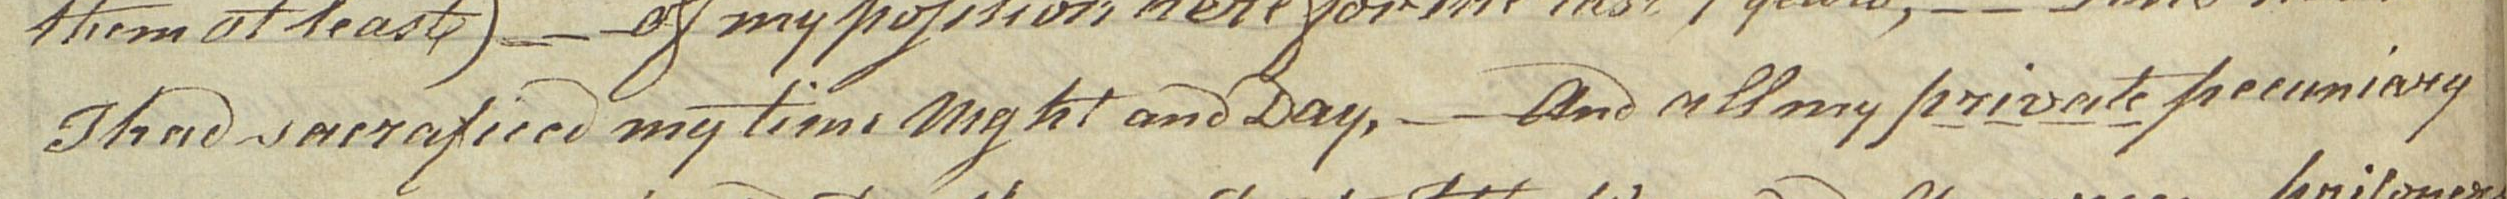I had sacraficed my time Night and Day, And all my private pecuniary
